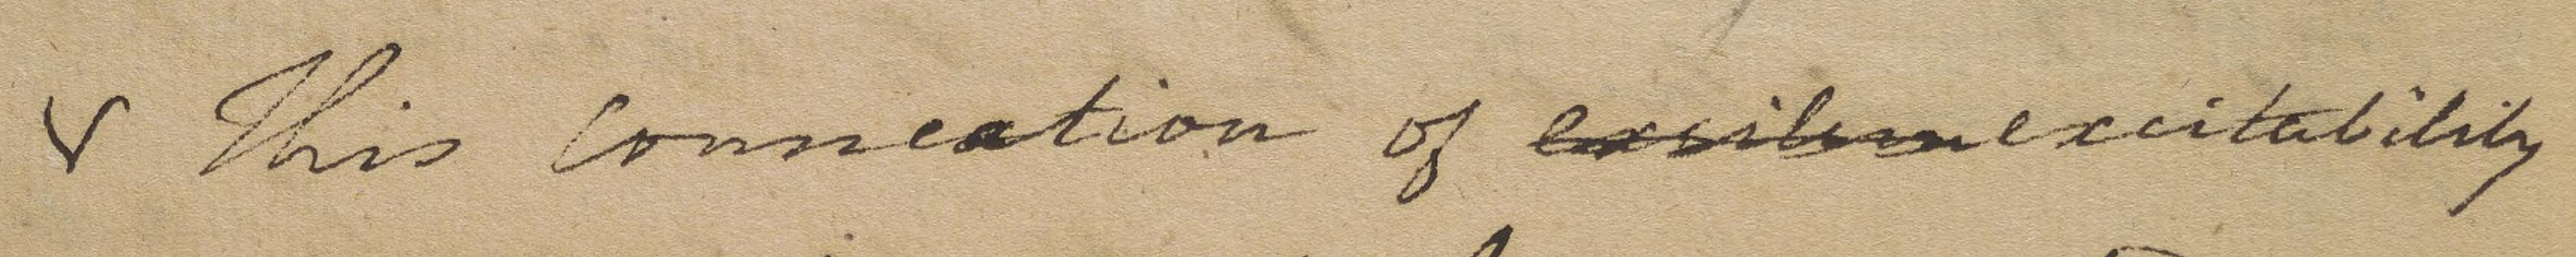V This connection of [excitem] excitability
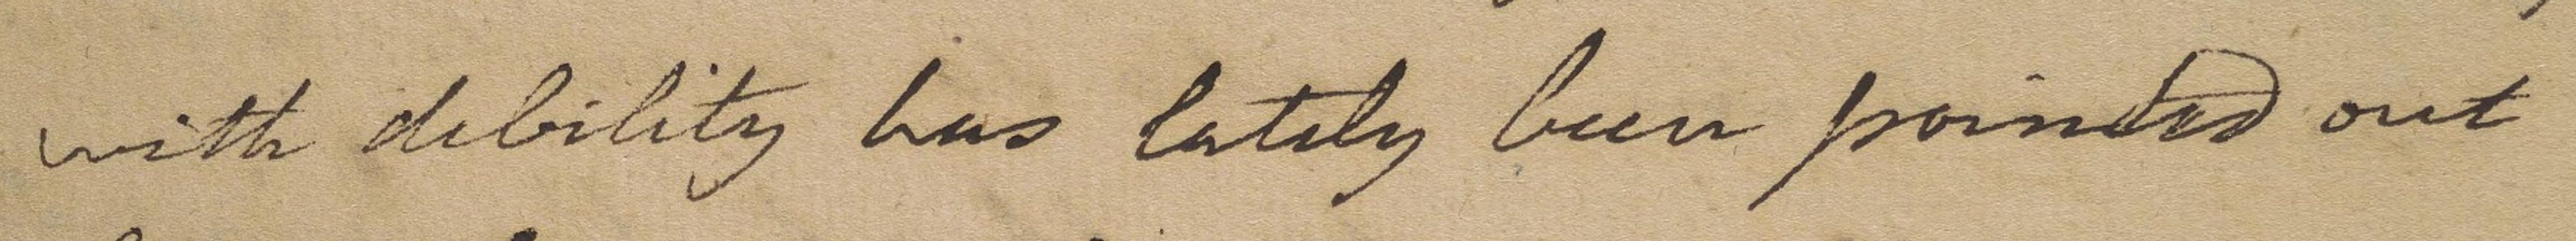with debility has lately been pointed out
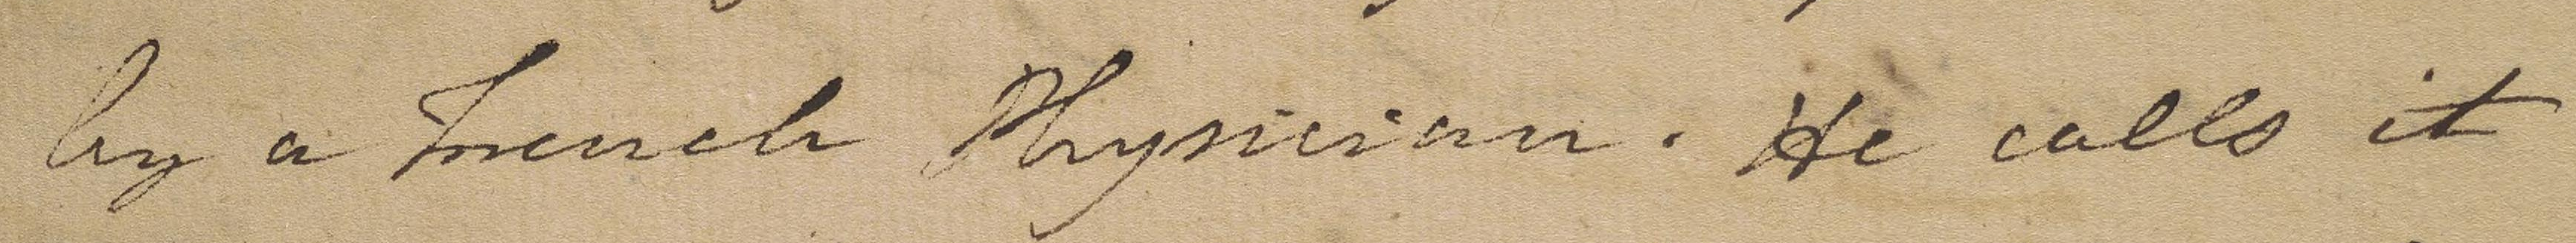by a French physician. He calls it
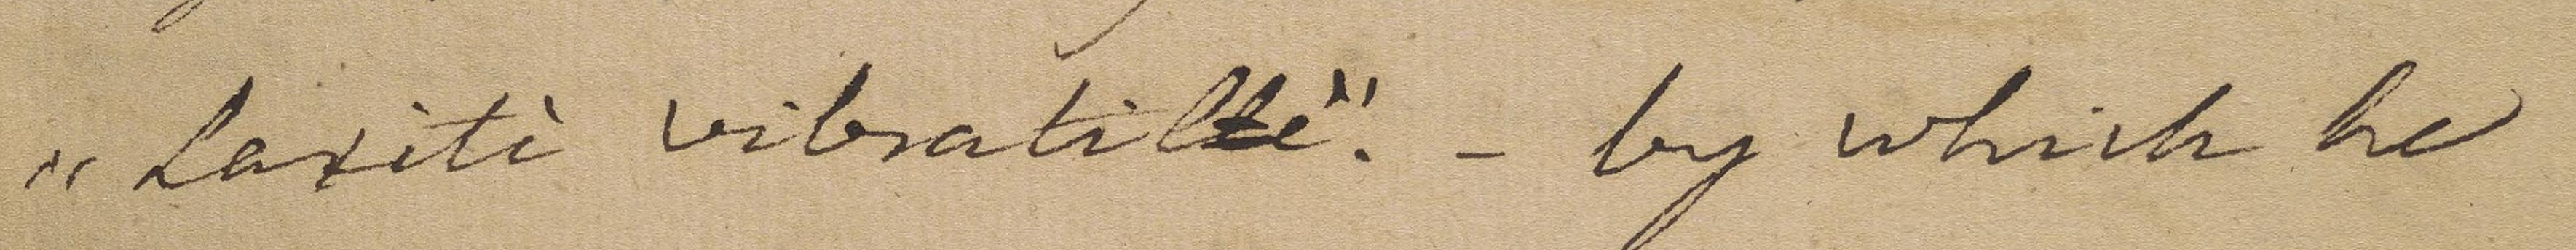"Laxité vibratil[l]e" by which he
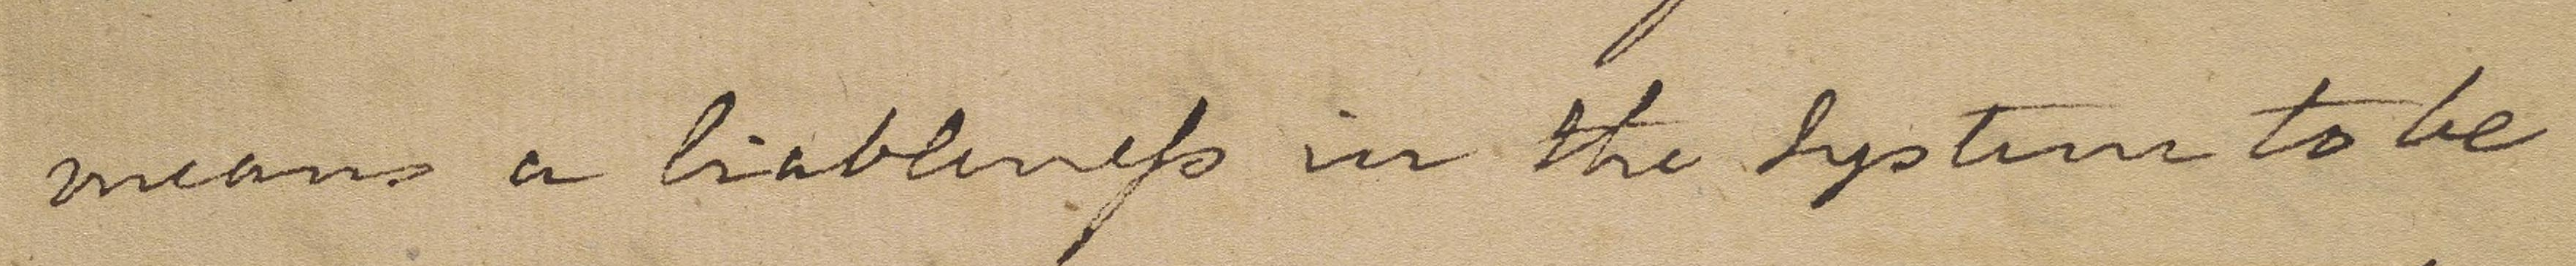means a liableness in the system to be
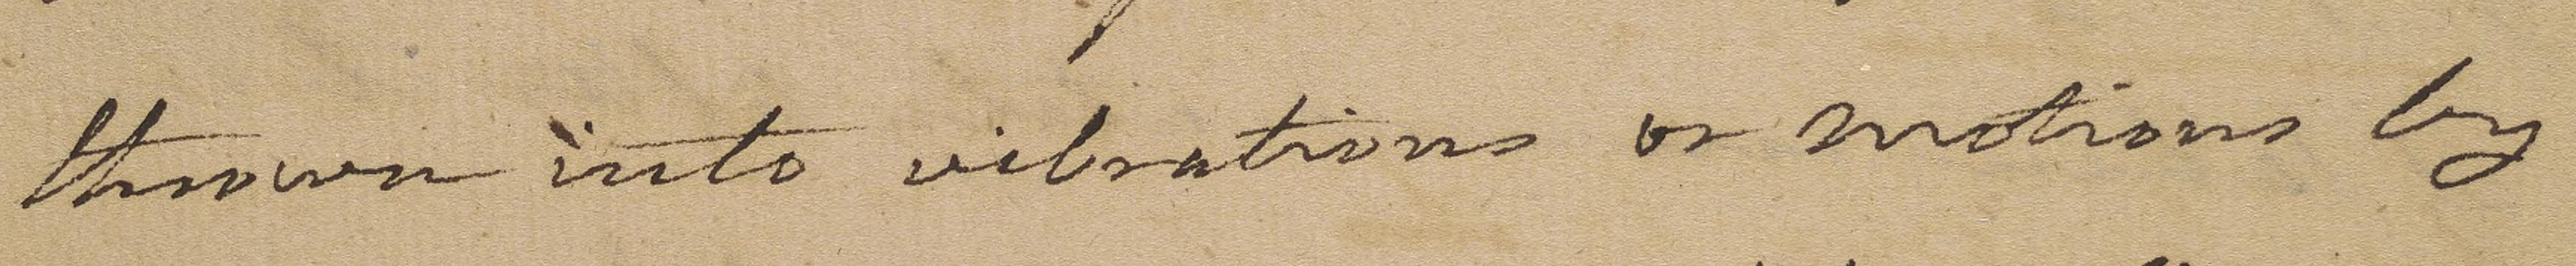thrown into vibrations or motions by
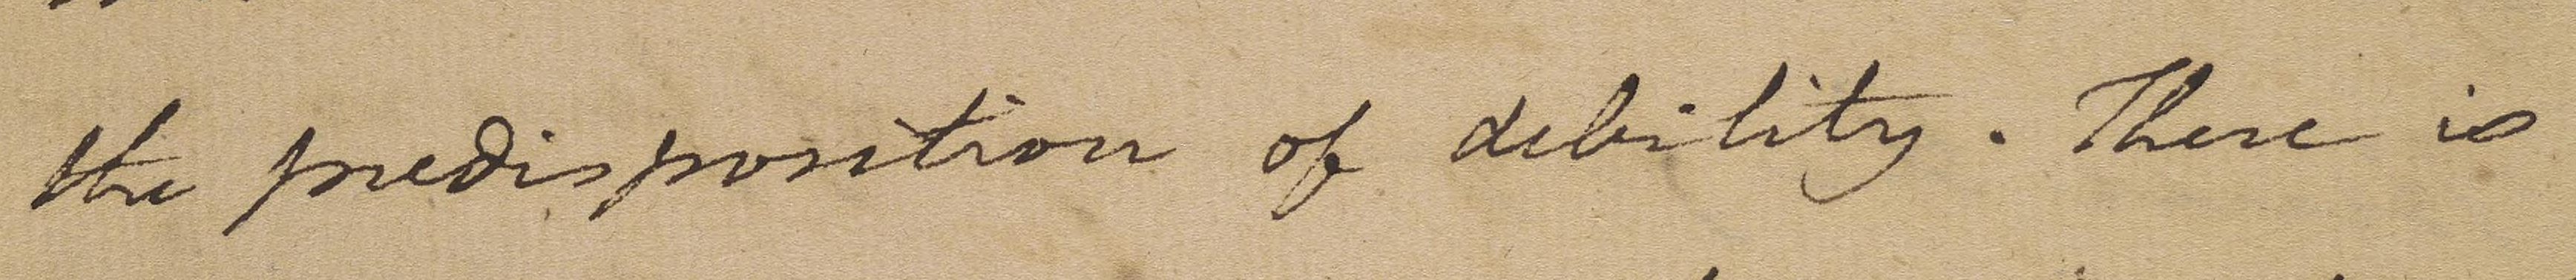the predisposition of debility. There is
